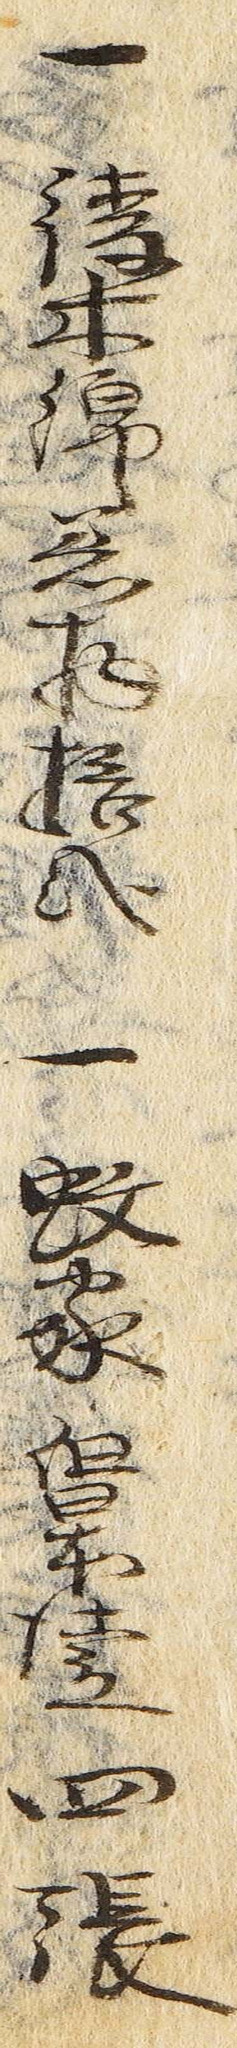一綾木綿着物拾弐一蚊家但日本仕立四張
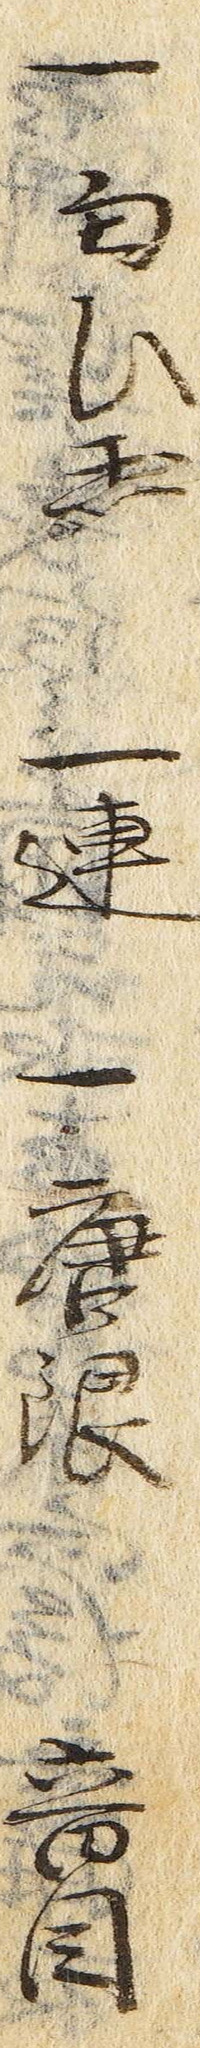一匂ひ玉一連一唐銀六百目
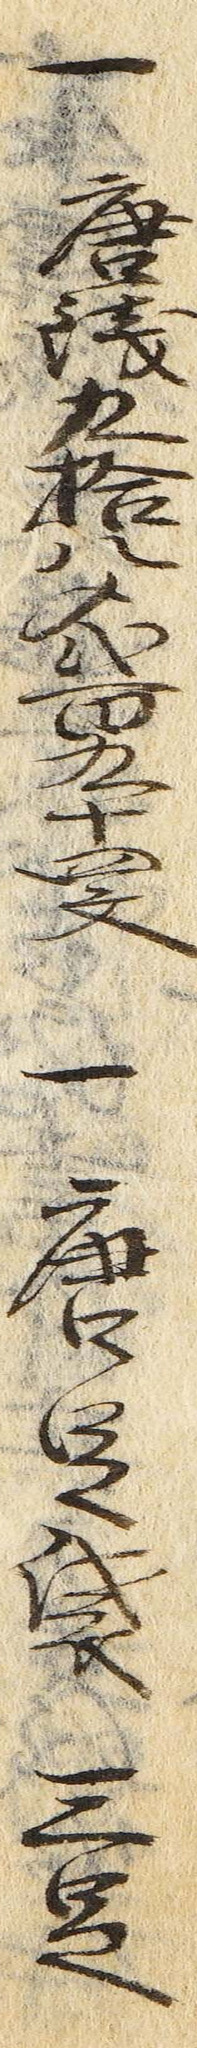一唐銭九拾八貫弐百九十四文一唐足袋三足
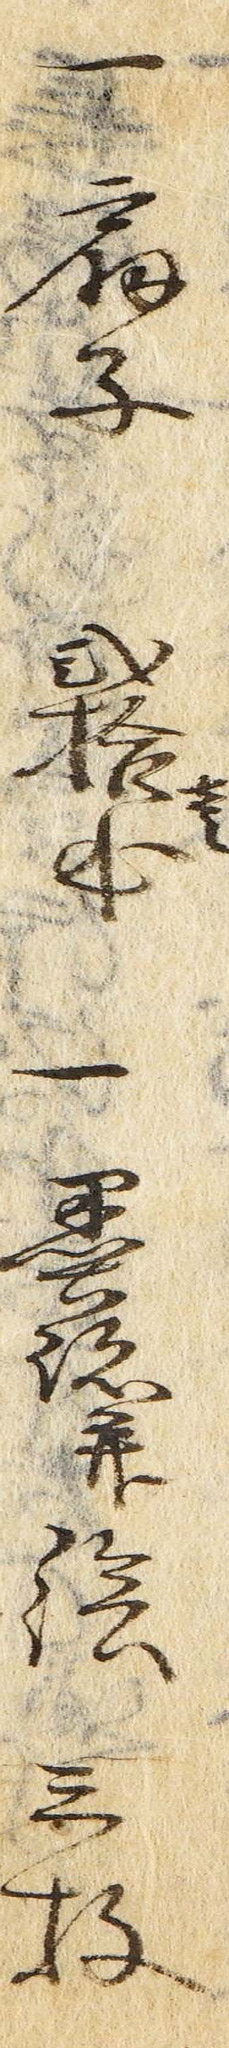一扇子弐拾壱本一墨跡幷絵三枚
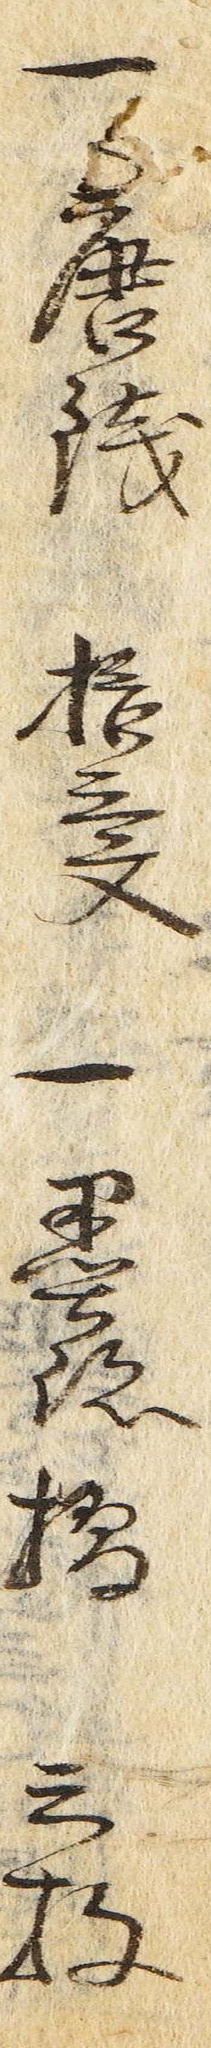一唐銭拾三文一墨跡摺三枚
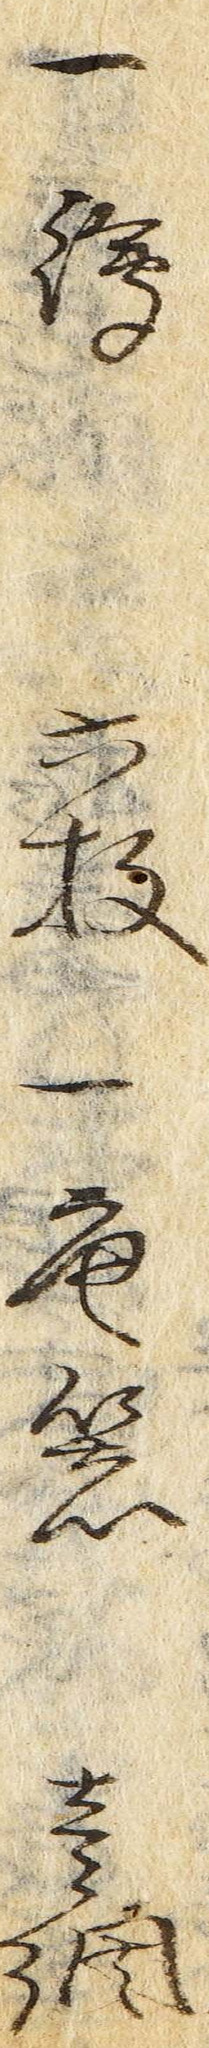一絵六枚一唐箸壱調
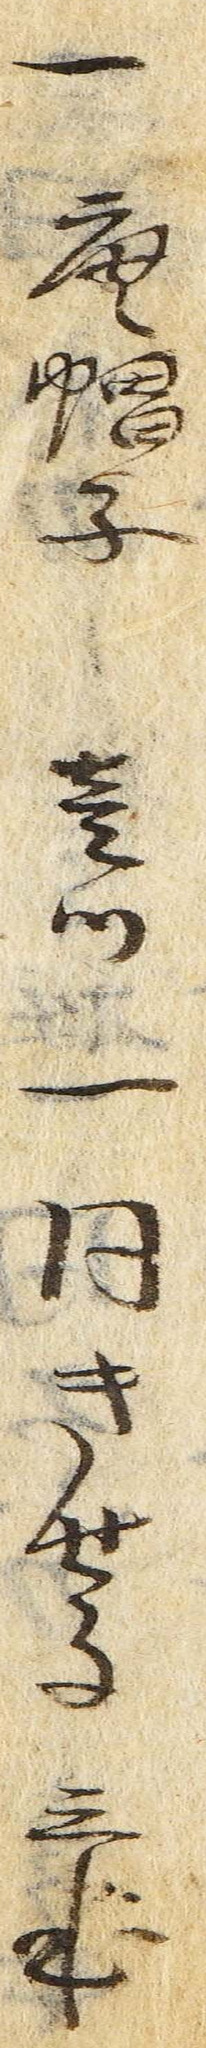一唐帽子壱ツ一同きせる三本
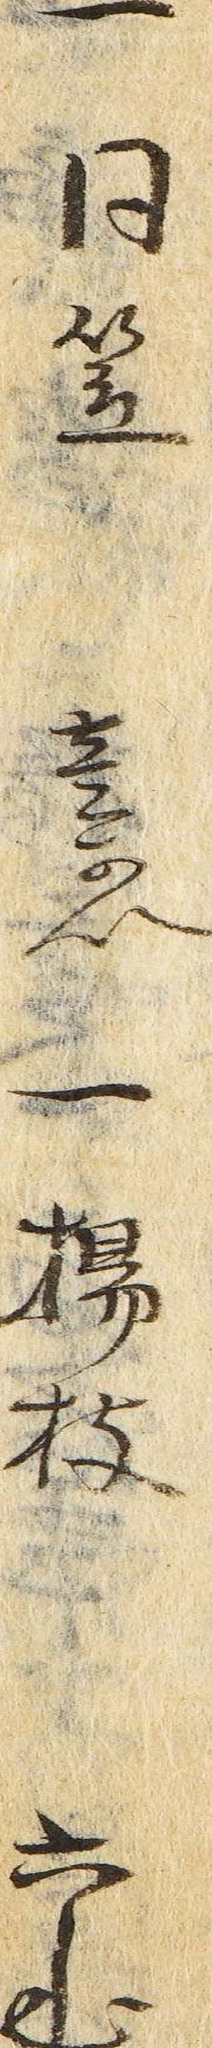一同笠壱かい一楊枝六本

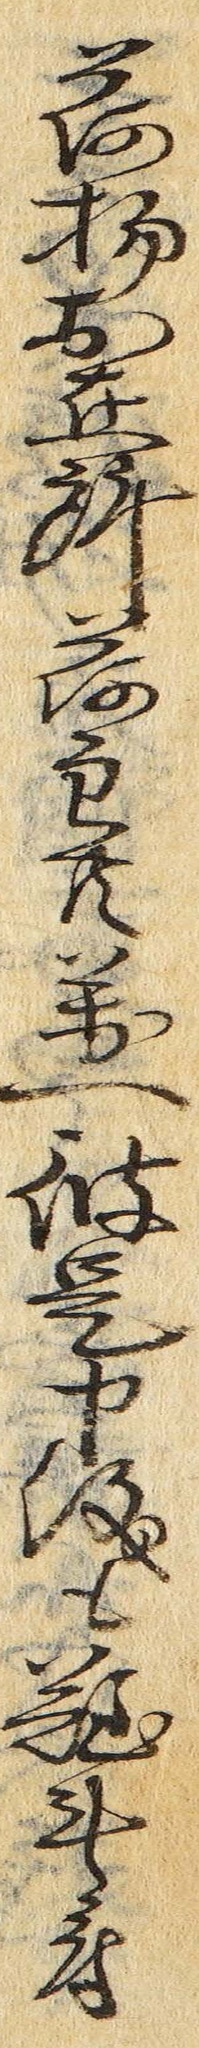荷物於在所荷主共万一彼是申儀も難計ニ付
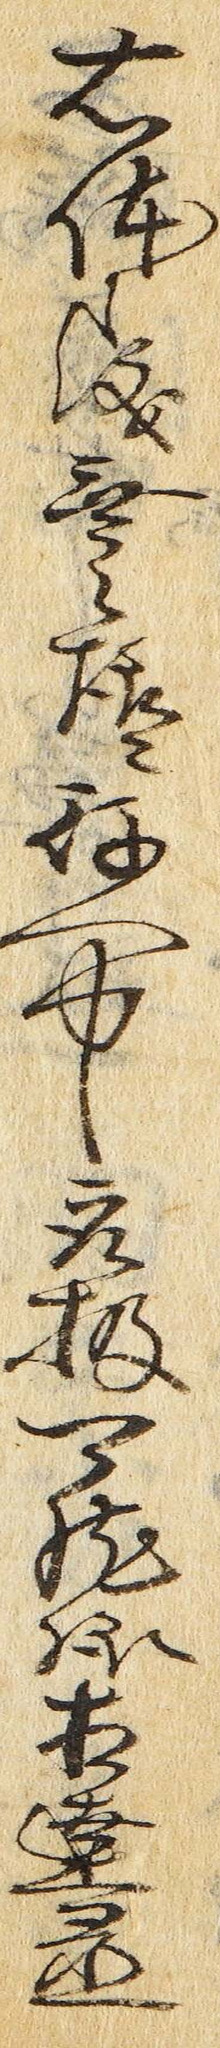右体之儀無之様ニ役人申取扱可然様相達置
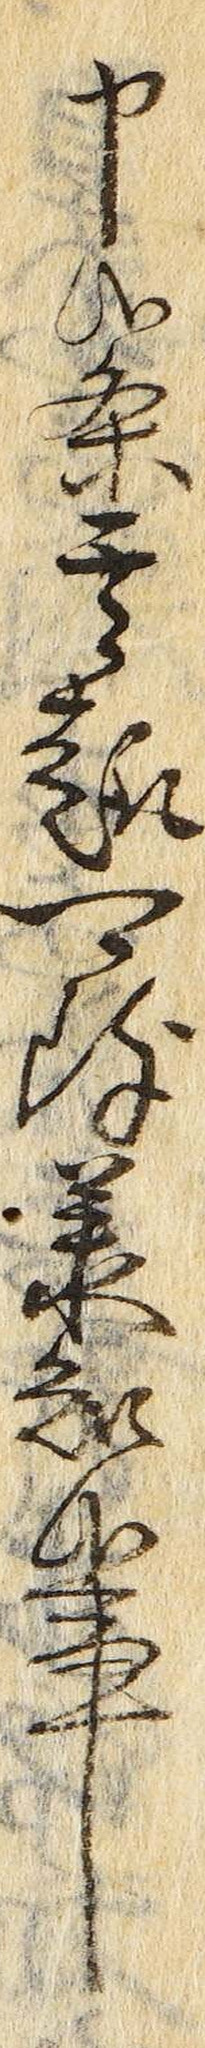申候条其趣可致承知候事
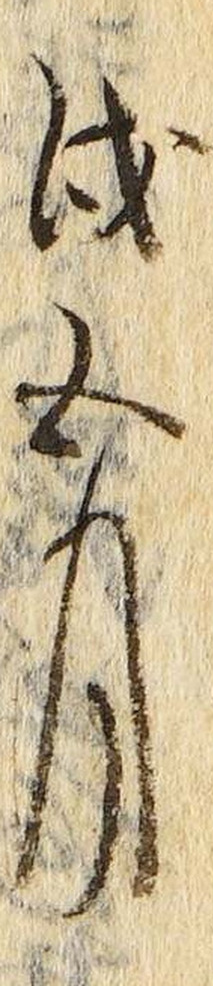戌五月
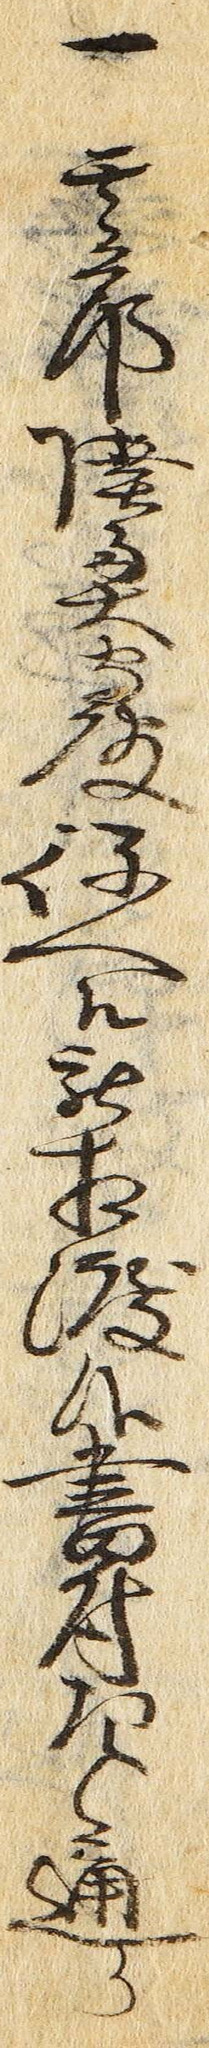一其節陸奥守殿役人江被相渡候書付左之通り
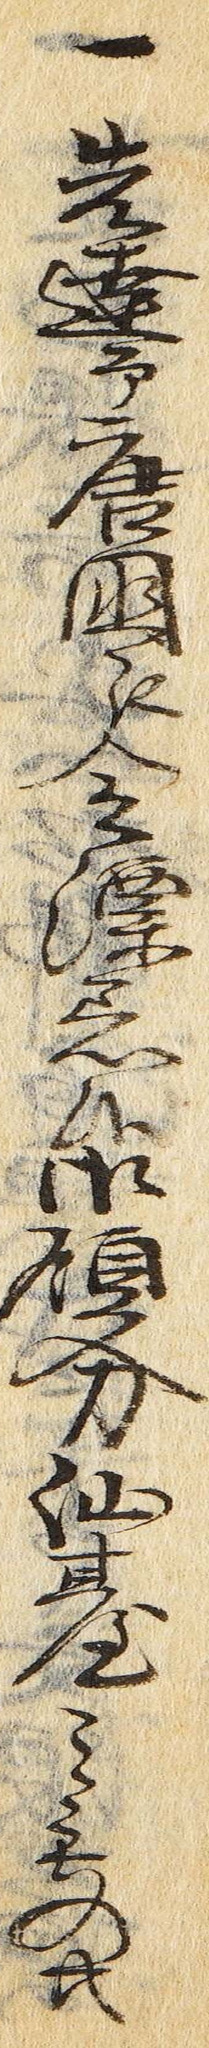一先達而唐国江今漂着候御領分仙台之もの共
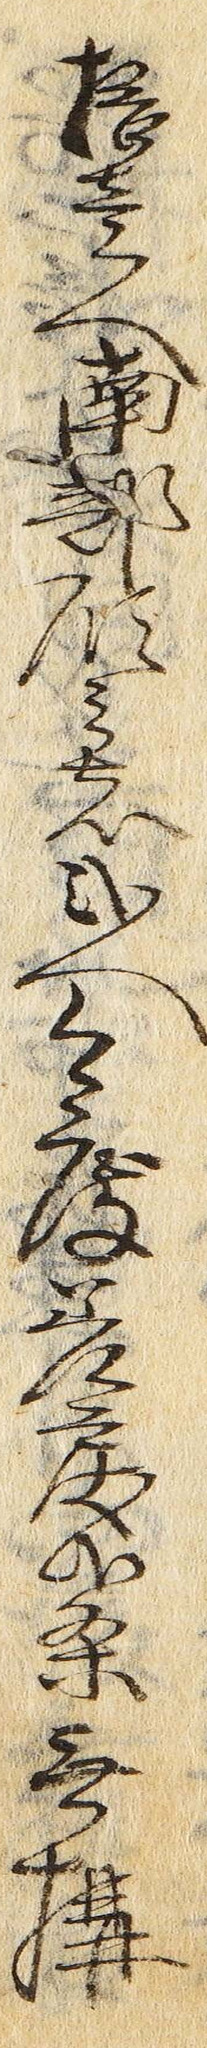拾壱人南部領之者弐人今度差戻候条無構
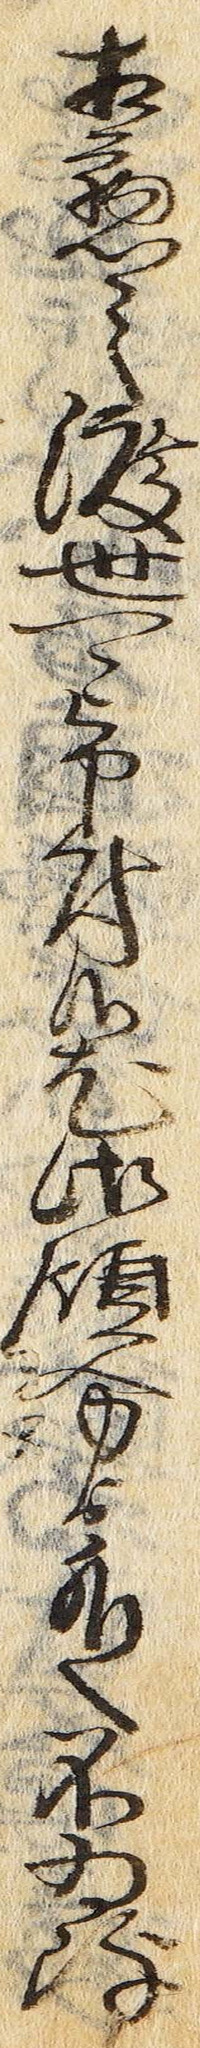相応之渡世可被申付候尤御領分ゟ外へ不為致
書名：奥州仙台領之者唐国江漂流一件
